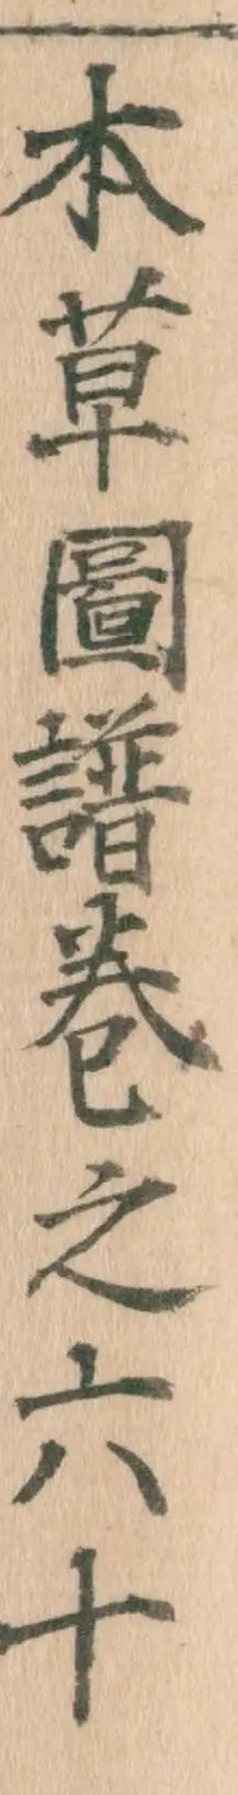本草図譜巻之六十
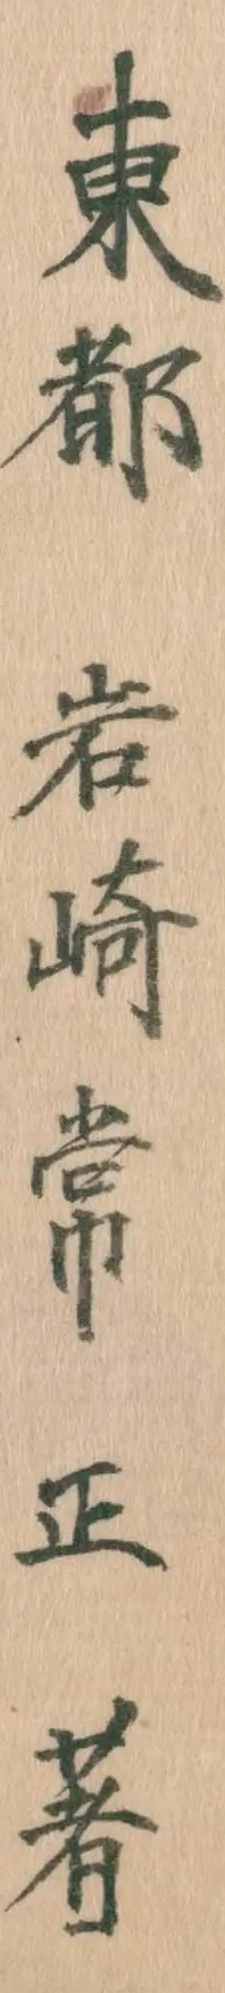東都岩崎常正著

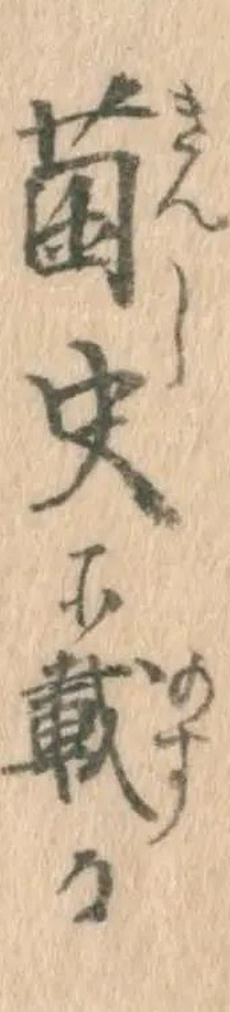菌史に載る
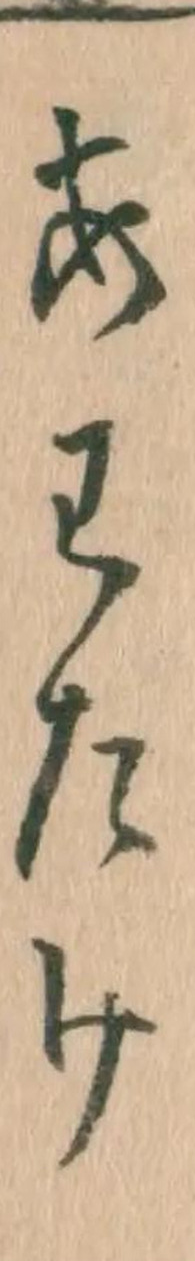あわたけ
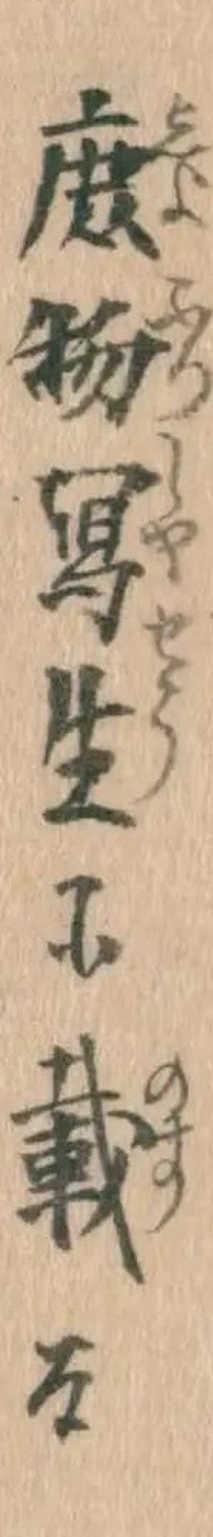庶物写生に載る
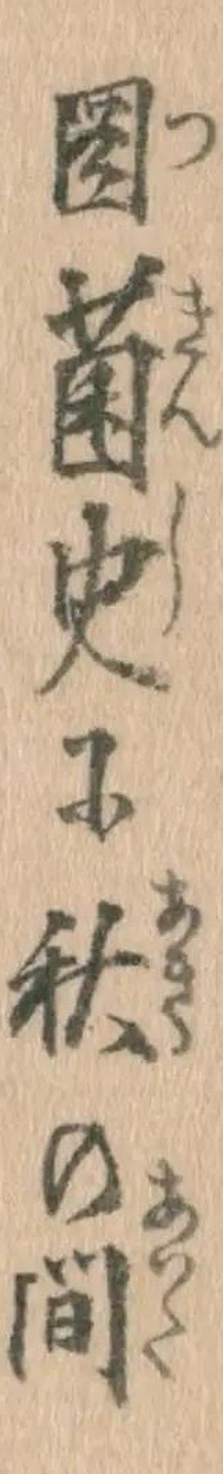図菌史に秋の間
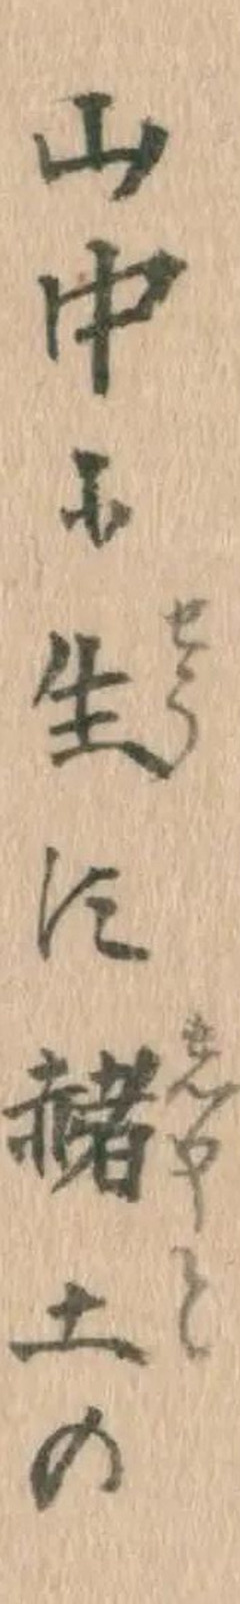山中に生す赭土の
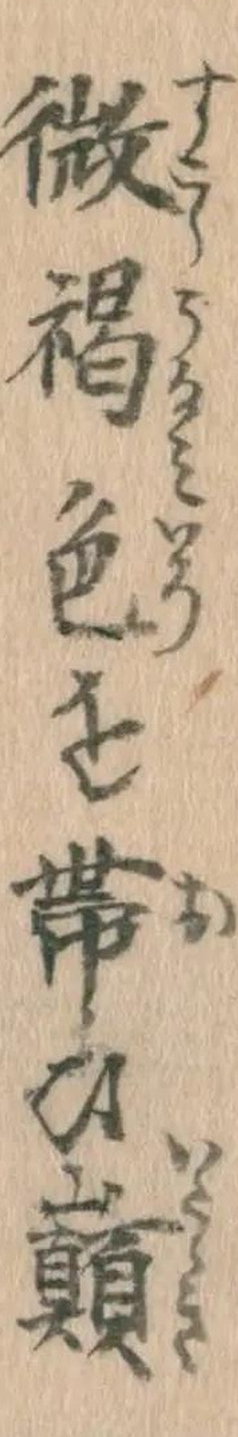微褐色を帯ひ巓
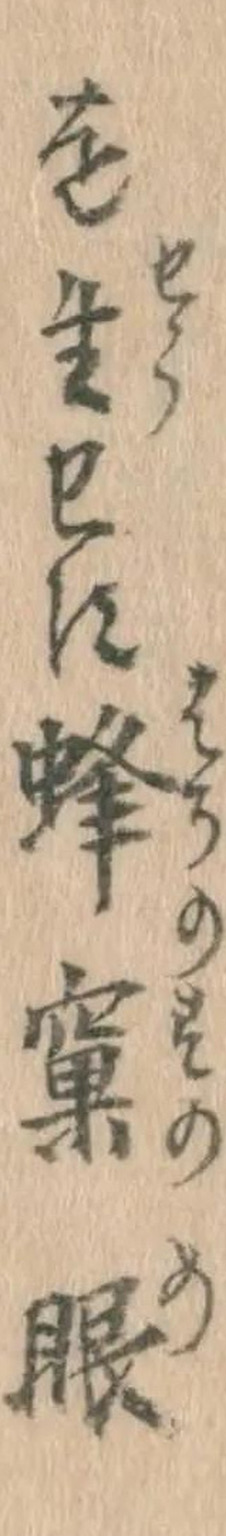を生せす蜂窠眼
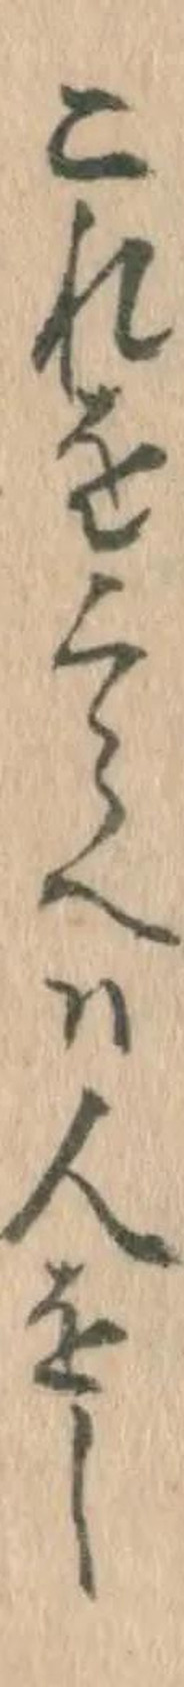これをくらへは人をし
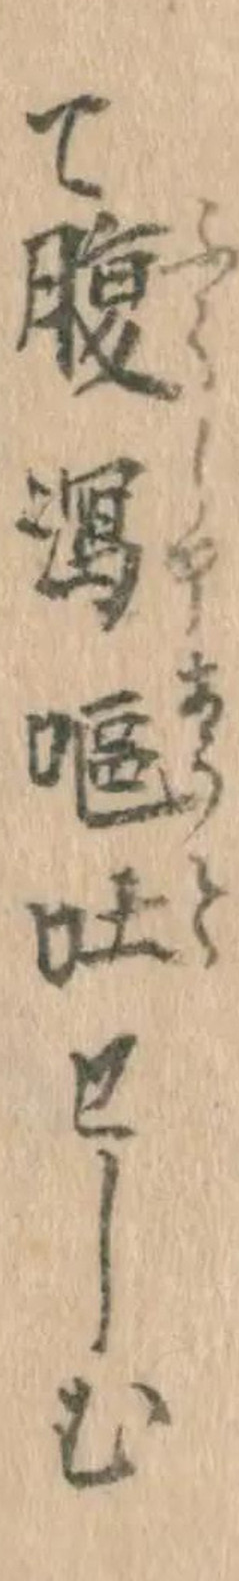て腹瀉嘔吐せしむ
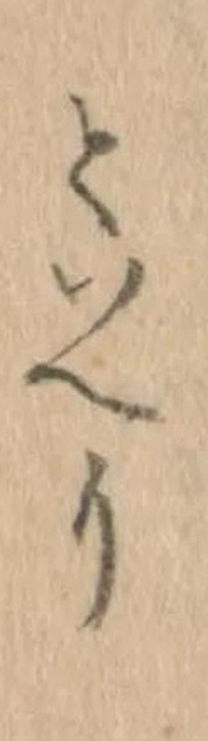といへり

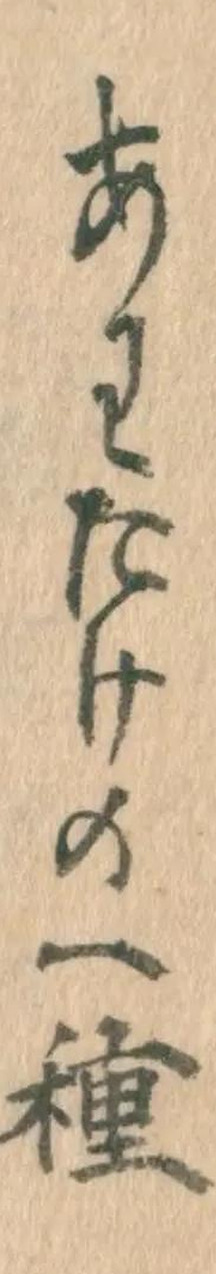あわたけの一種
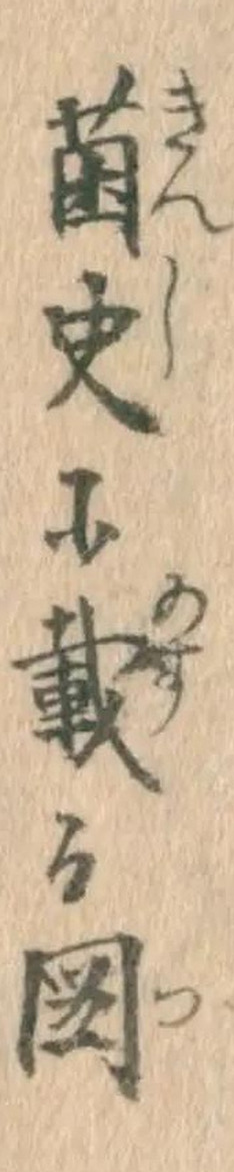菌史に載る図
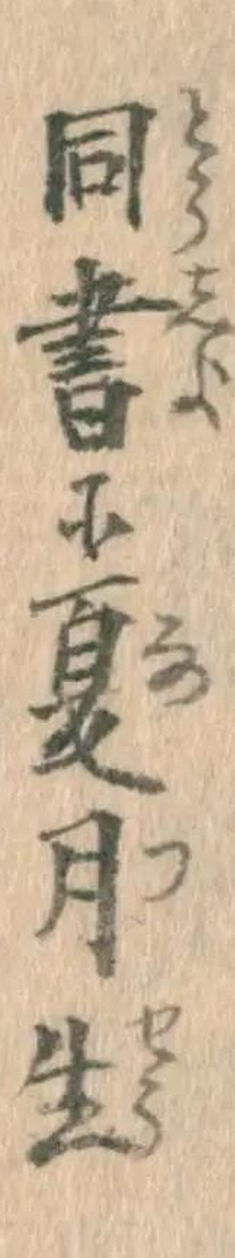同書に夏月生
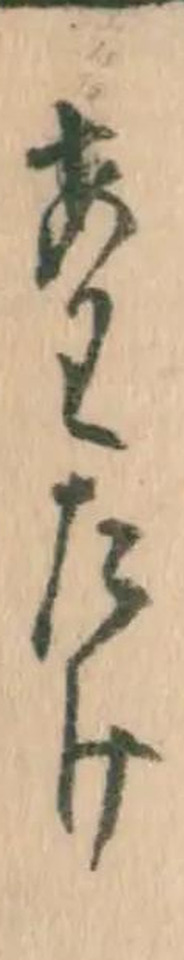あわたけ
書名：本草図譜. 巻58-60
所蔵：国立国会図書館 National Diet Library, JAPAN
